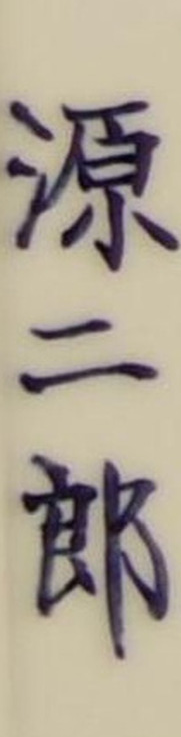源二郎

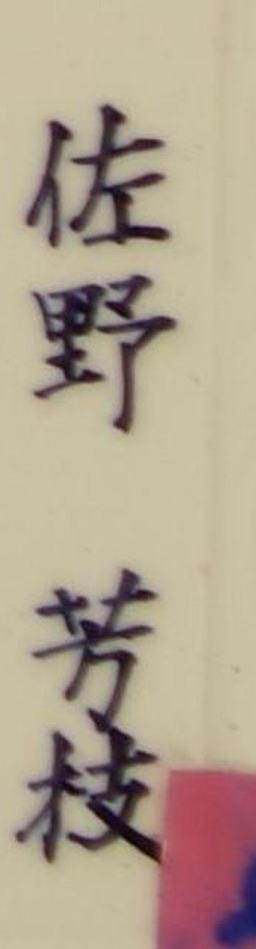佐野芳枝
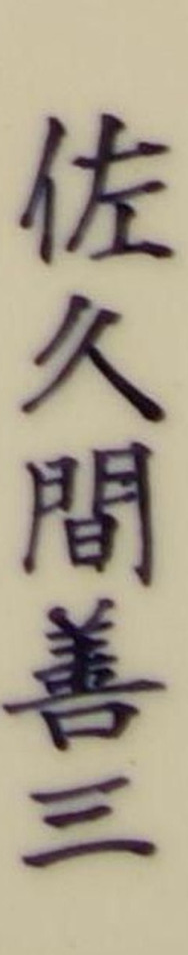佐久間善三
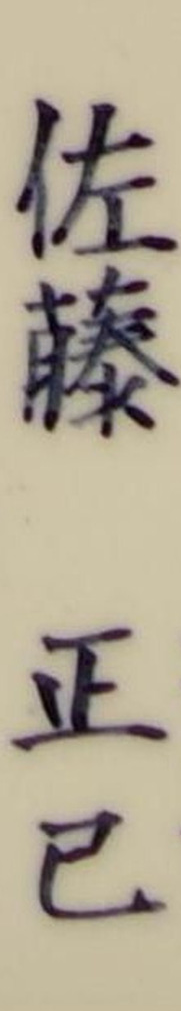佐藤正巳
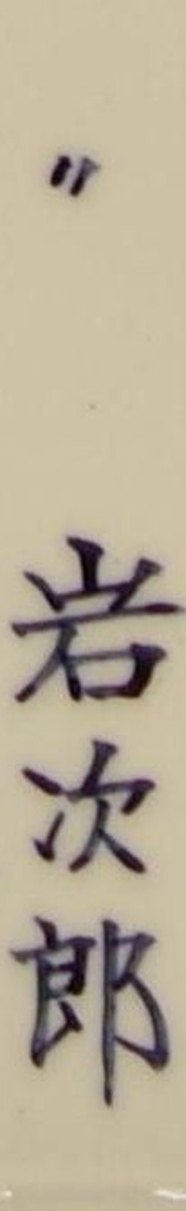岩次郎
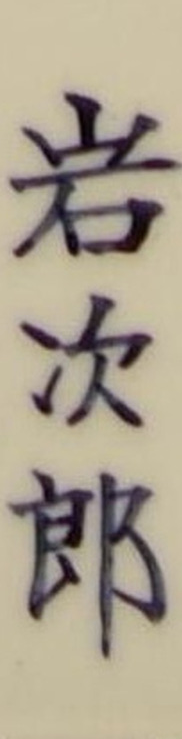岩次郎
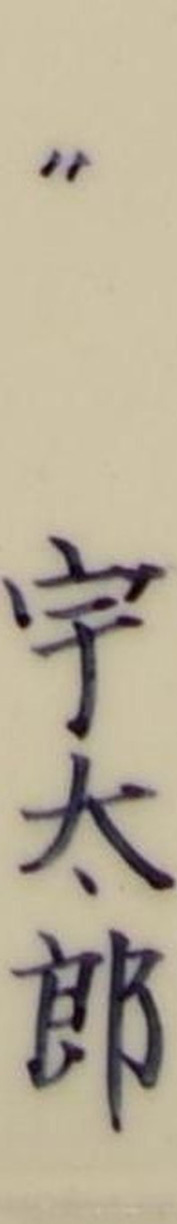宇太郎
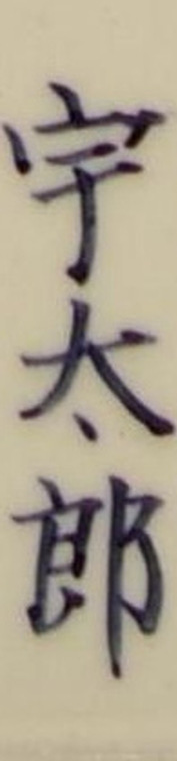宇太郎
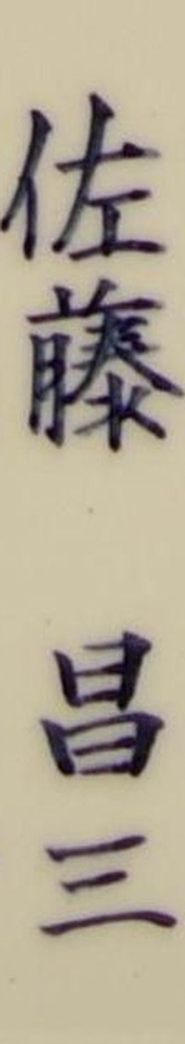佐藤昌三
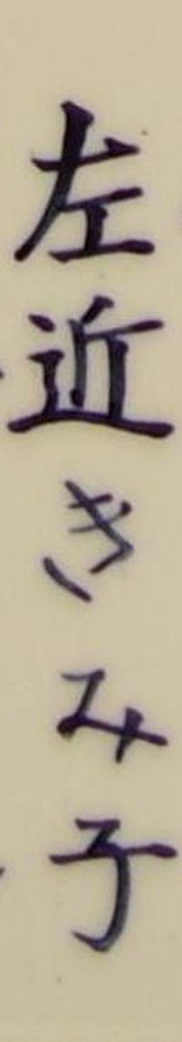左近きみ子
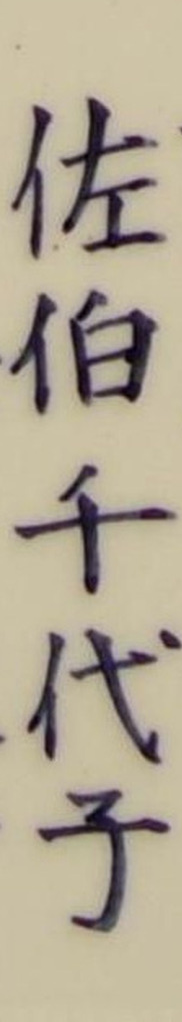佐伯千代子
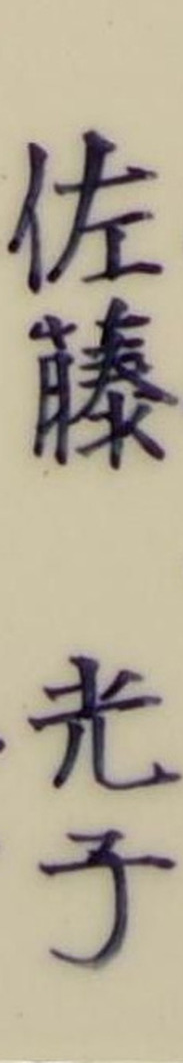佐藤光子
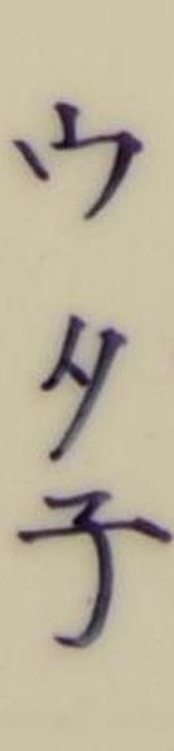ウタ子
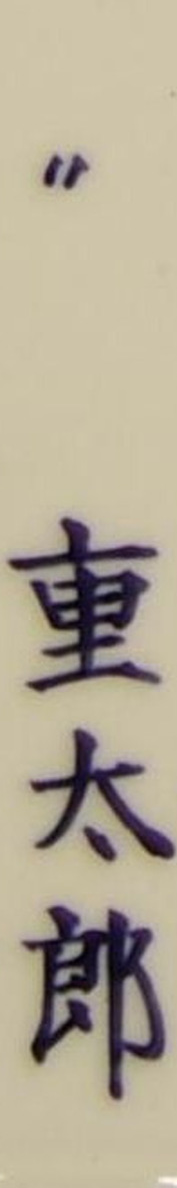重太郎
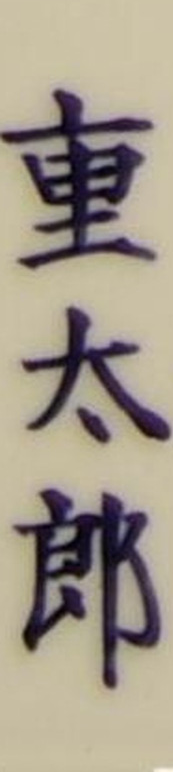重太郎

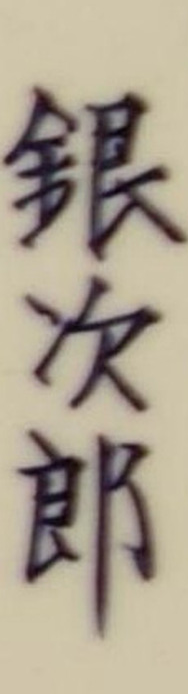銀次郎
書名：E~L
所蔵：高野山金剛峯寺
